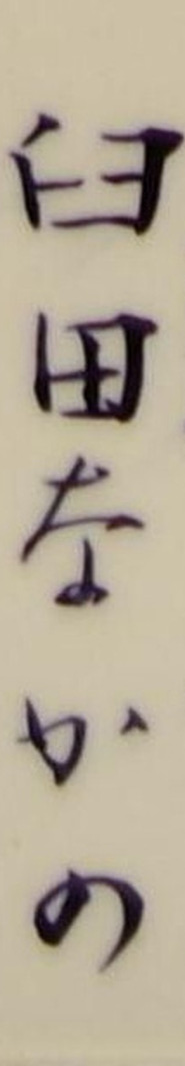臼田なかの
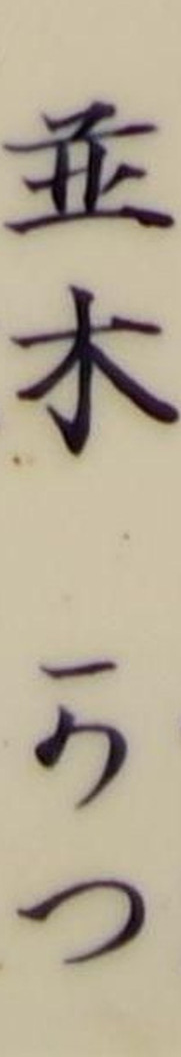並木かつ
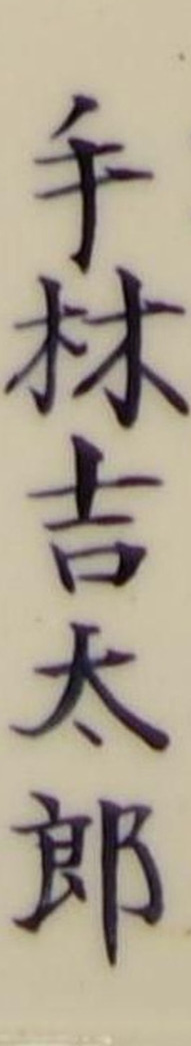手林吉太郎
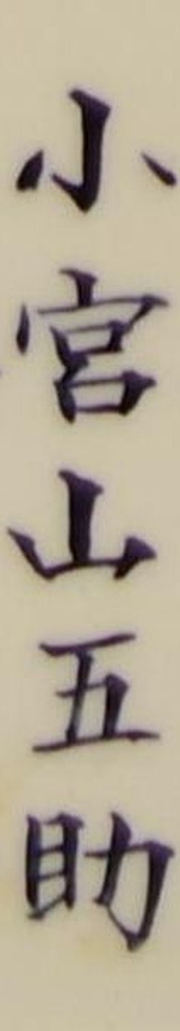小宮山五助
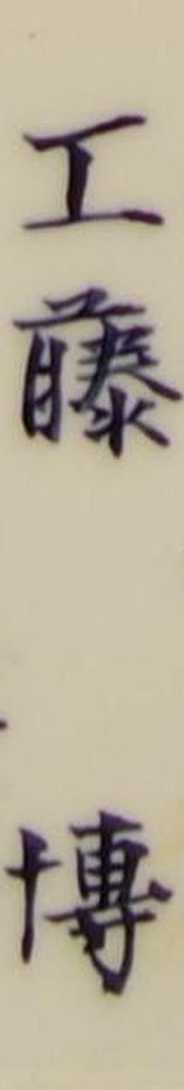工藤博
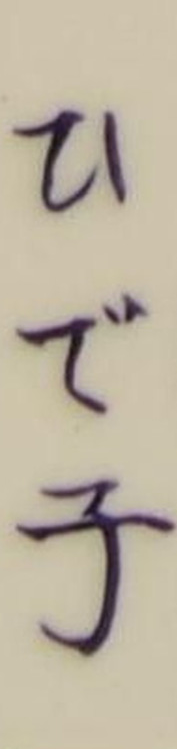ひで子
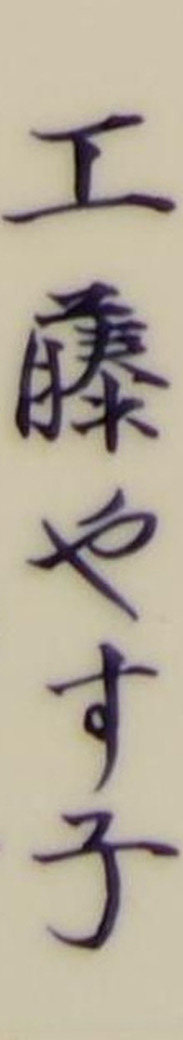工藤やす子
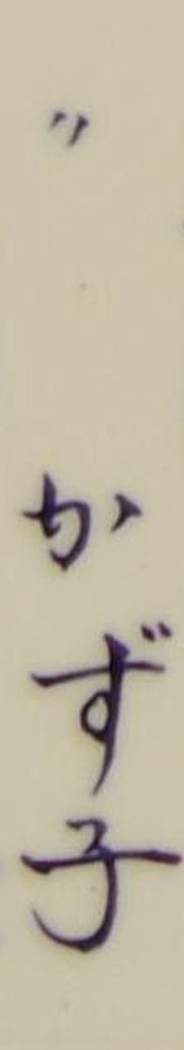かず子
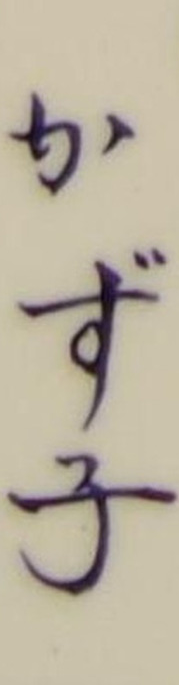かず子
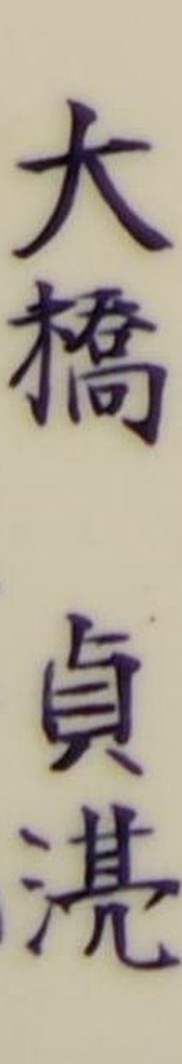大橋貞湛
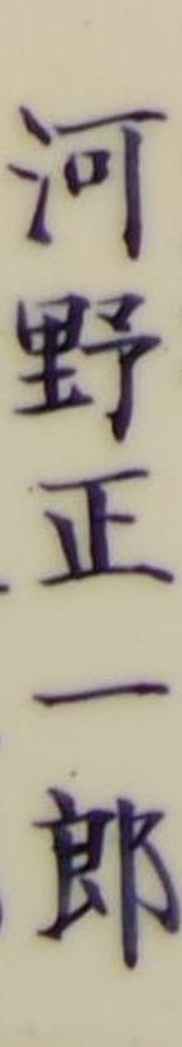河野正一郎
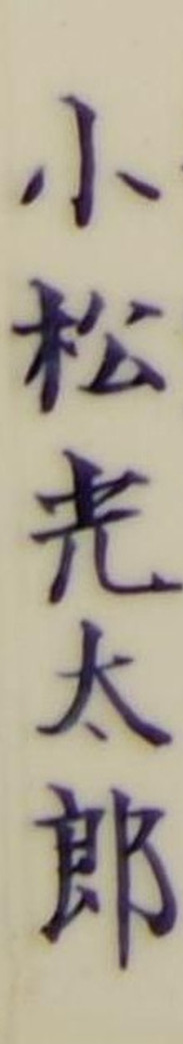小松光太郎

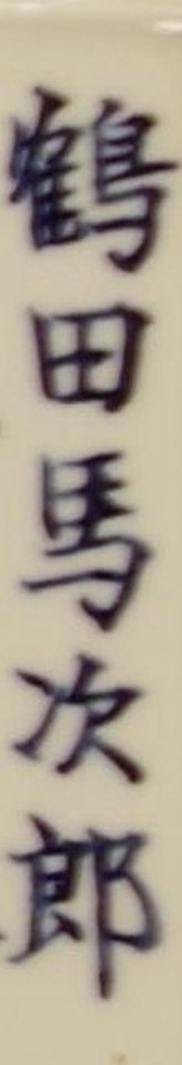鶴田馬次郎
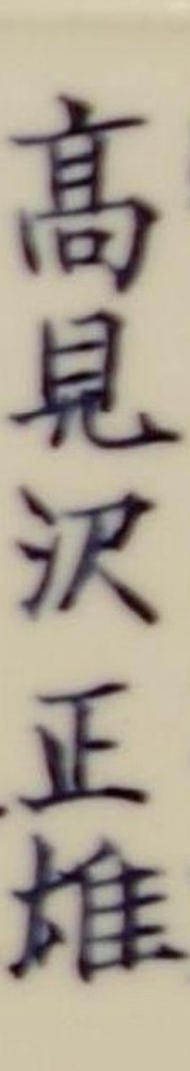高見沢正雄
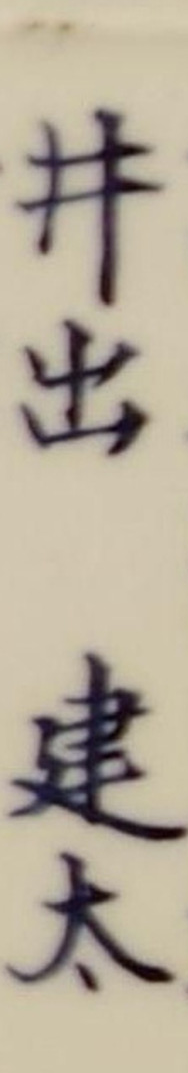井出建太
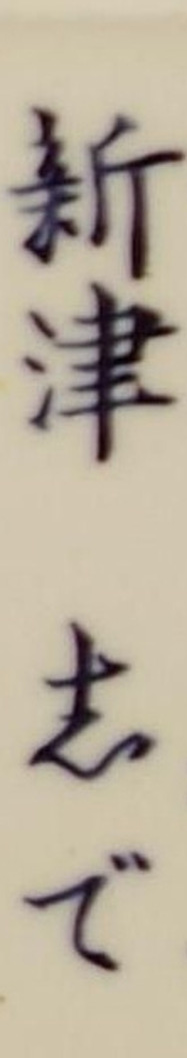新津しで
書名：A~D
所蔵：koyasan kongobuji
